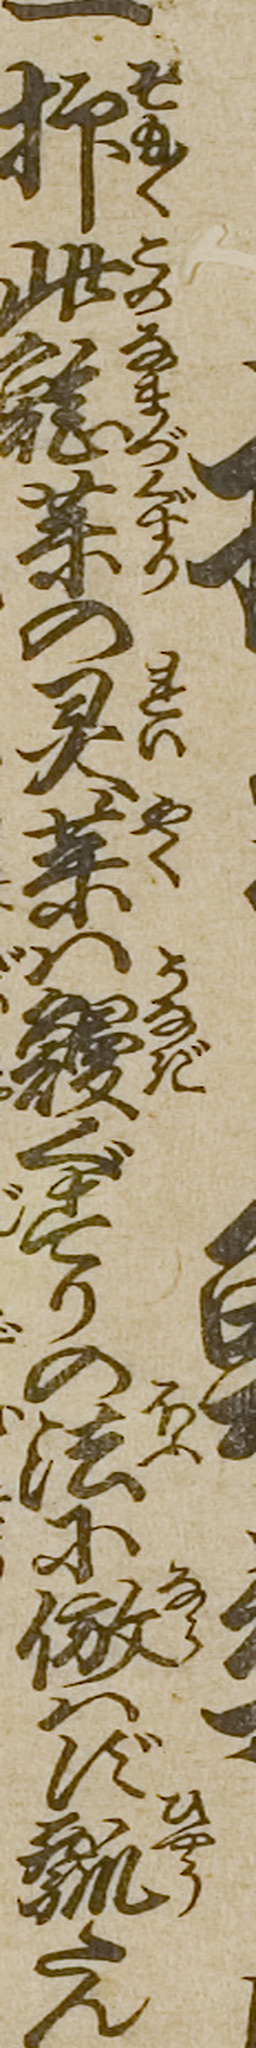一抑此鯰薬の霊薬は鰻ぐすりの法に倣はず瓢たん
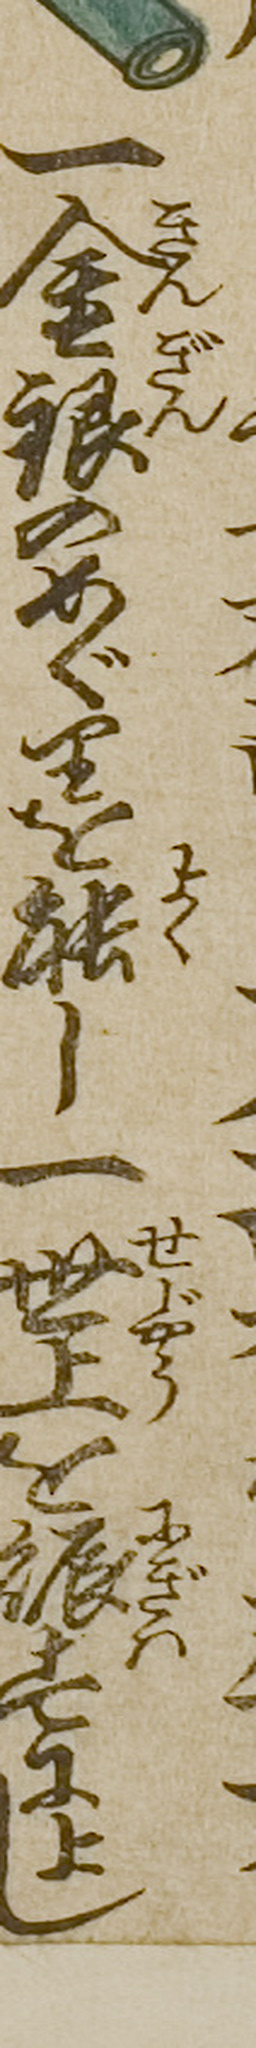一金銀のめぐりを能し一世上を賑すによし
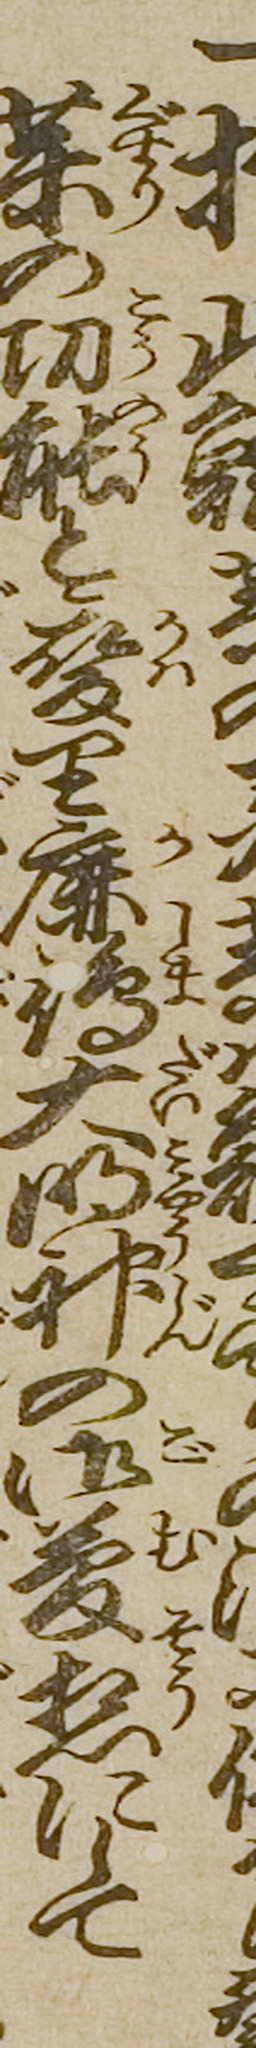薬の功能と変り鹿嶋大明神の御夢想にして
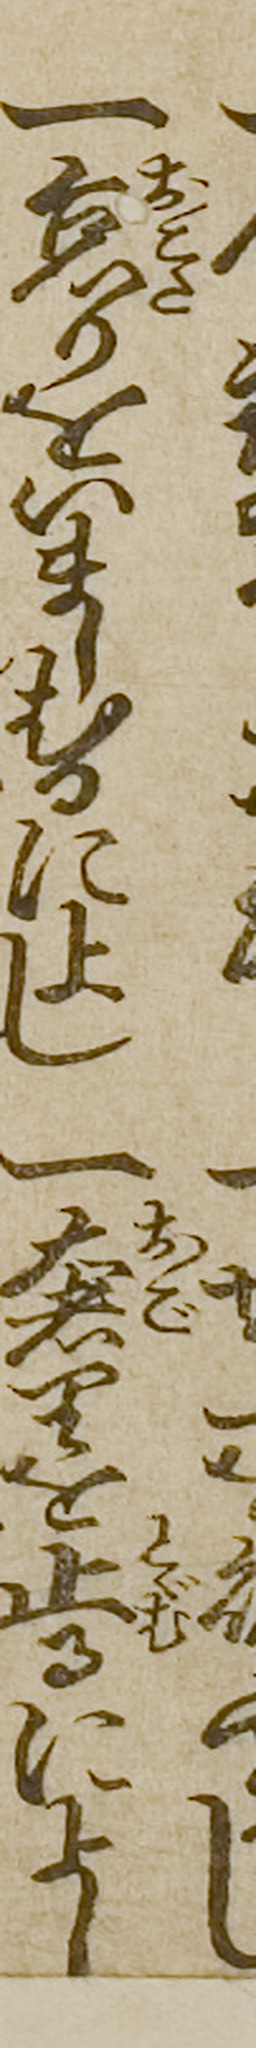一怠りをいましむるによし一奢りを止るによし
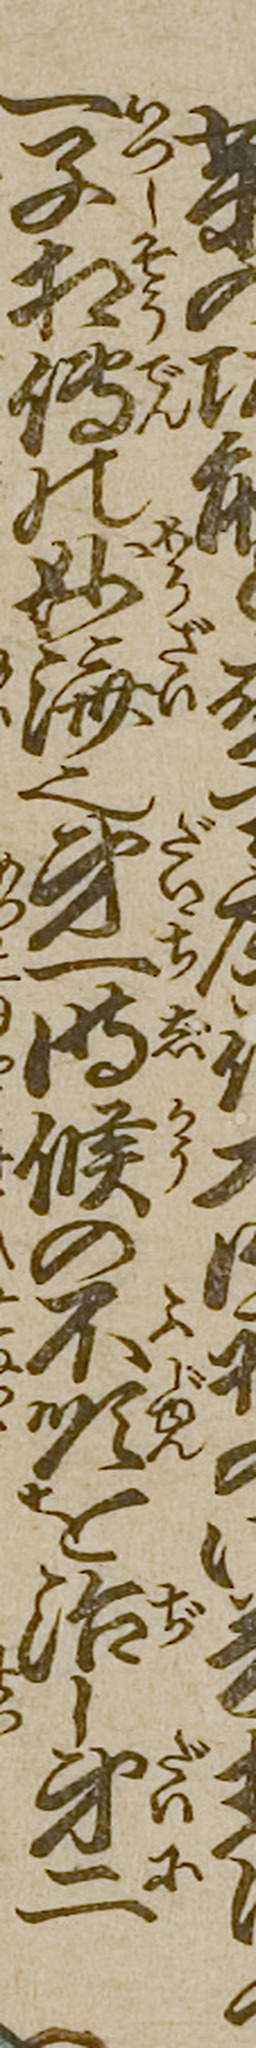一子相伝の妙済也第一時候の不順を治し第二
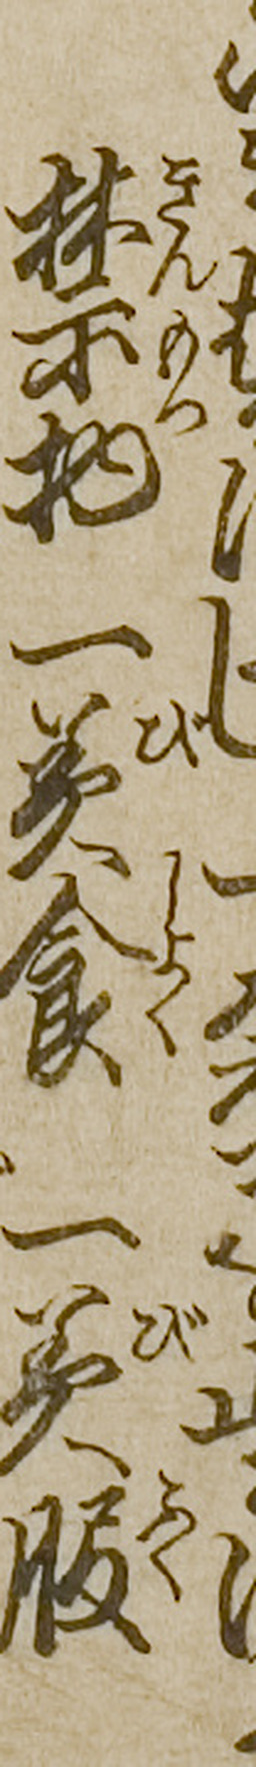禁物一美食一美服
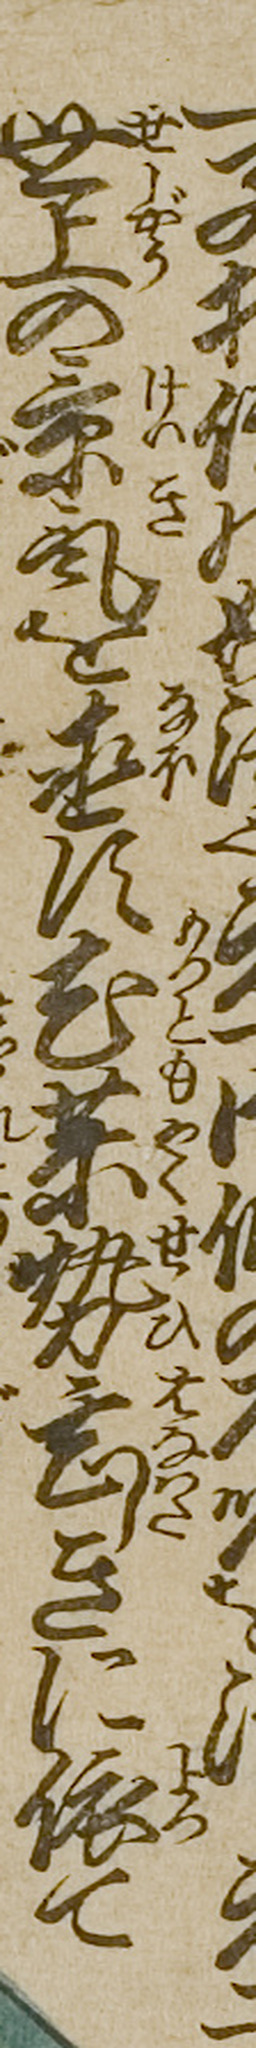世上の景気を直す尤薬勢甚しきに依て
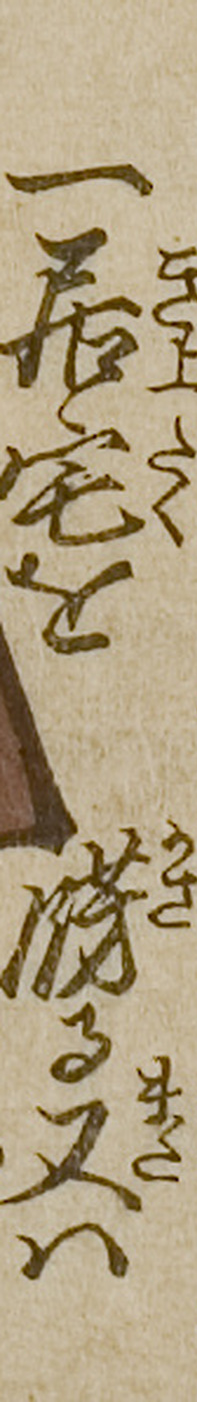一居宅を錺る又は
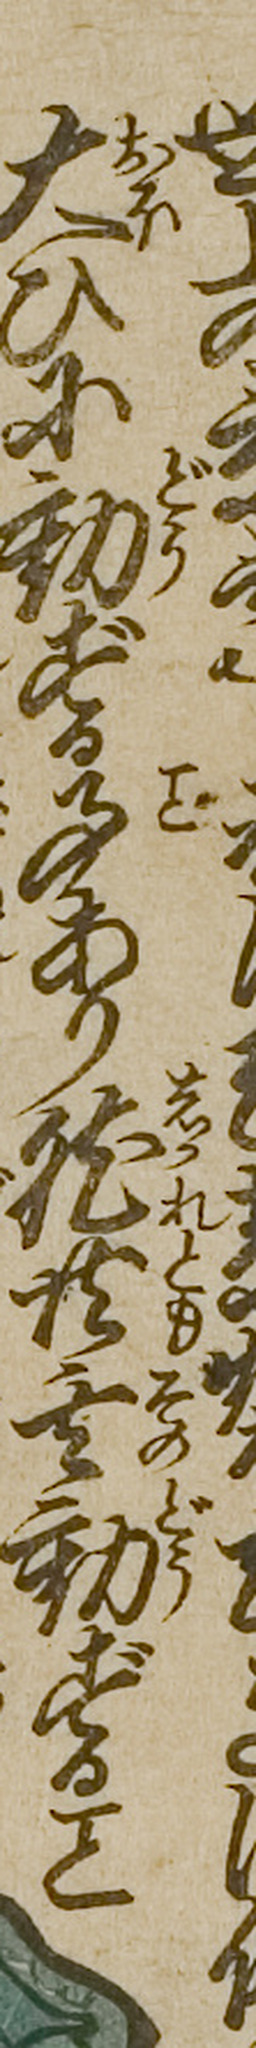大ひに動ずる事あり然共其動ずること
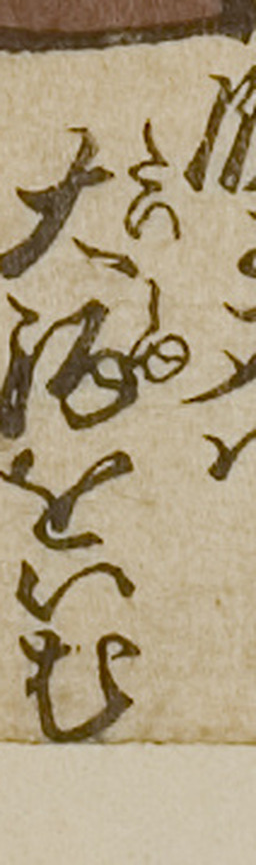大酒をいむ
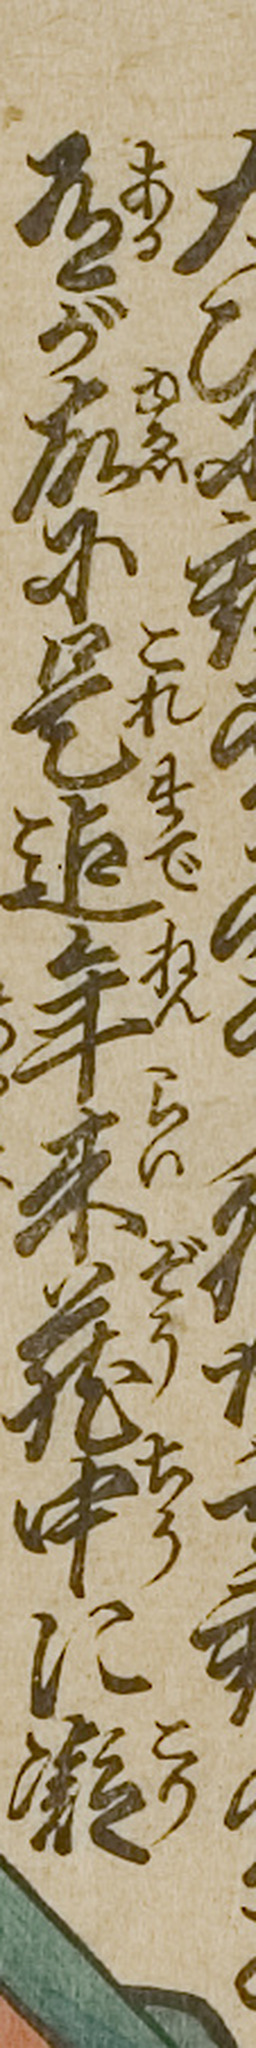有が故に是迄年来蔵中に凝
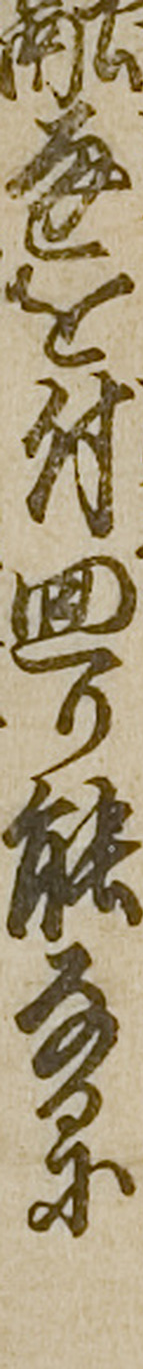融通を付廻り能なるに
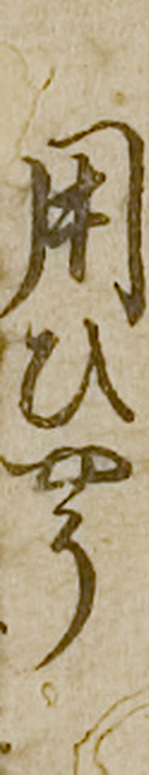用ひやう
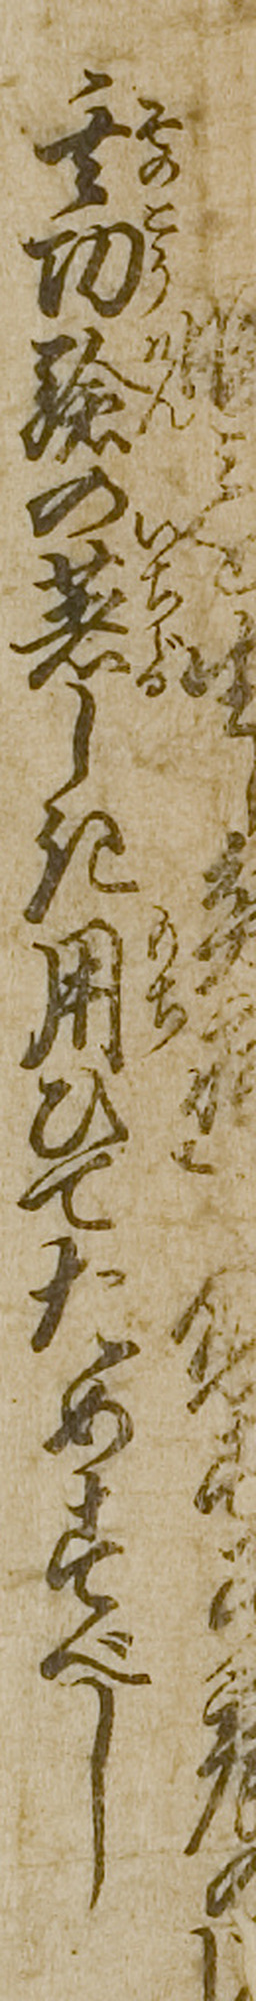其功験の著しき用ひてためすべし
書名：振出し鯰薬
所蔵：東京大学総合図書館 General Library in the University of Tokyo, JAPAN
